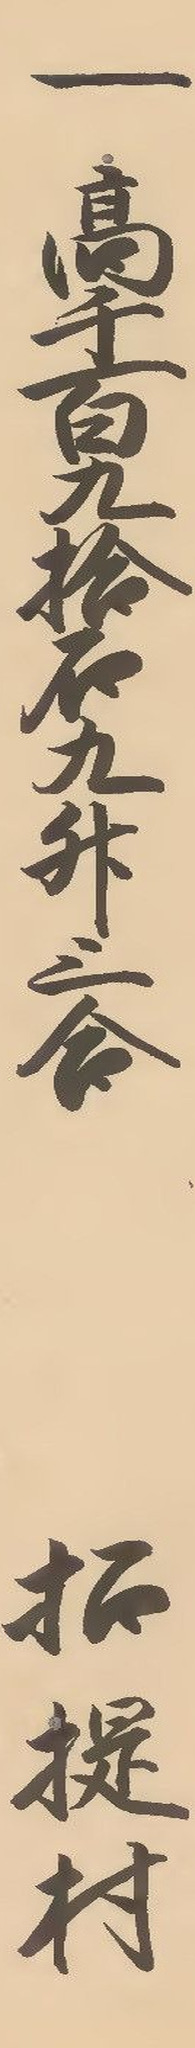一高千百九拾石九升三合招提村
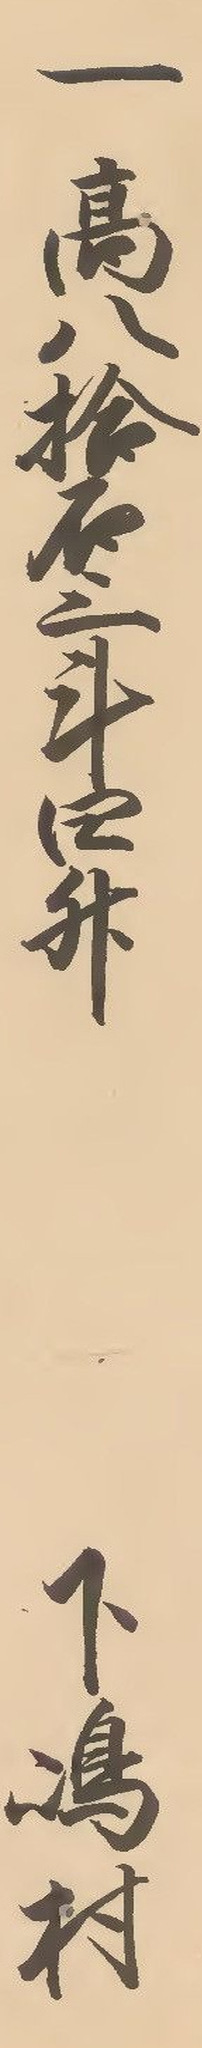一高八拾石三斗四升下島村
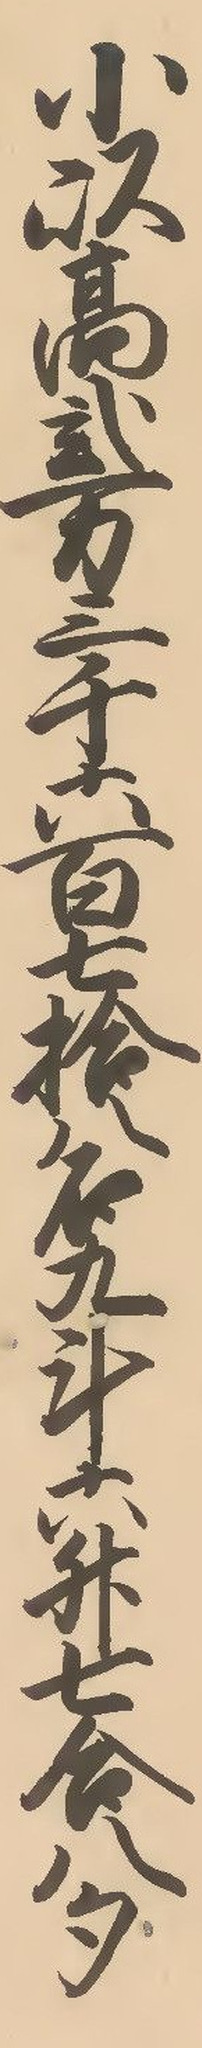小以高弐万三千六百七拾八石九斗六升七合八勺

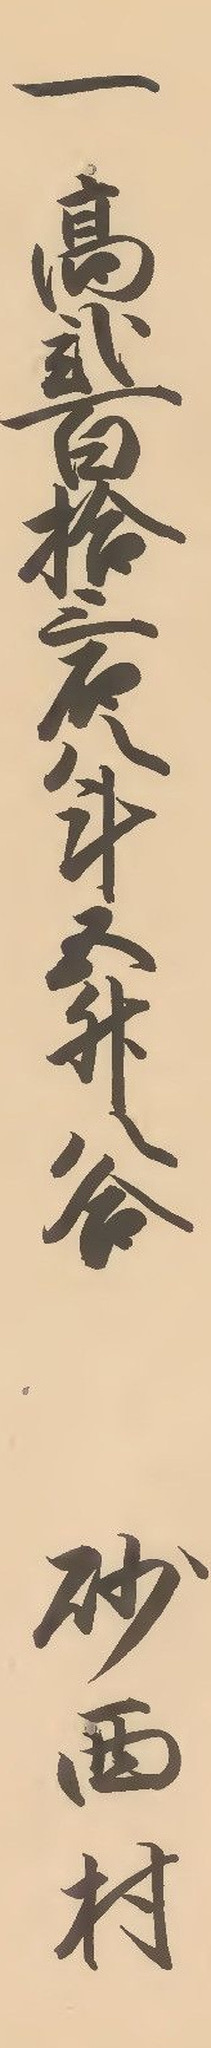一高弐百拾三石八斗五升八合砂西村
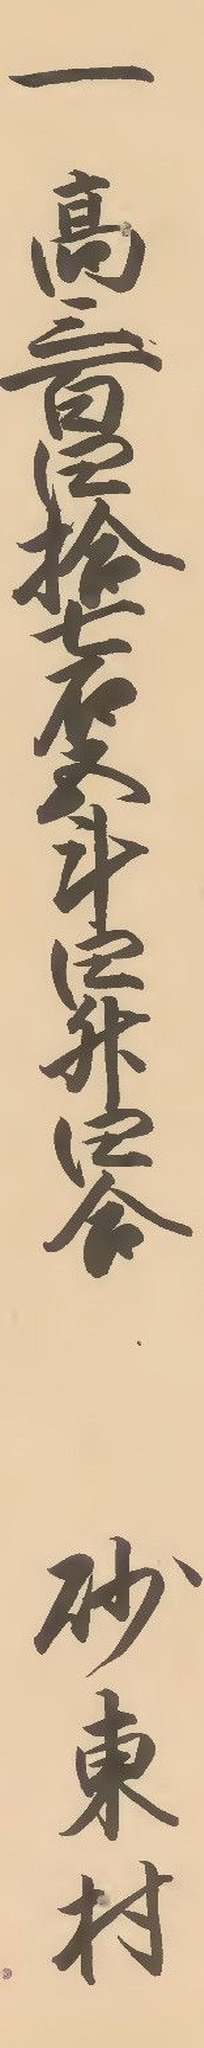一高三百四拾七石五斗四升四合砂東村
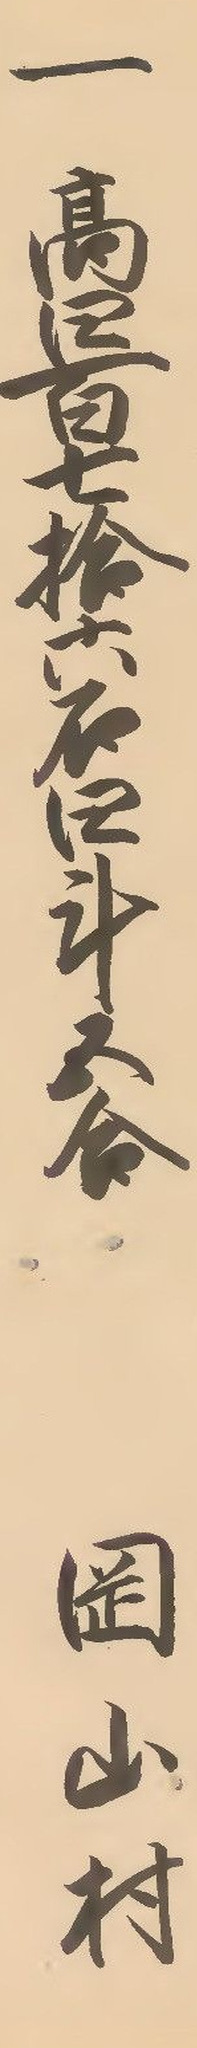一高四百七拾六石四斗五合岡山村
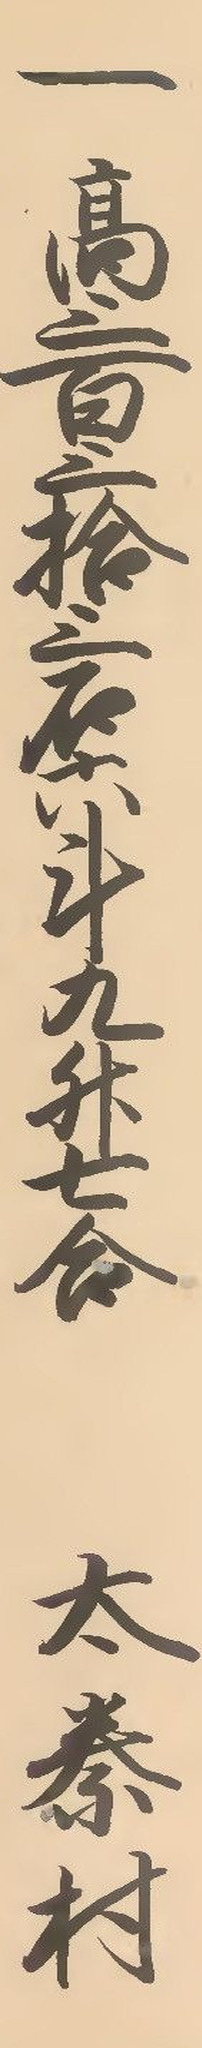一高三百三拾三石六斗九升七合太秦村
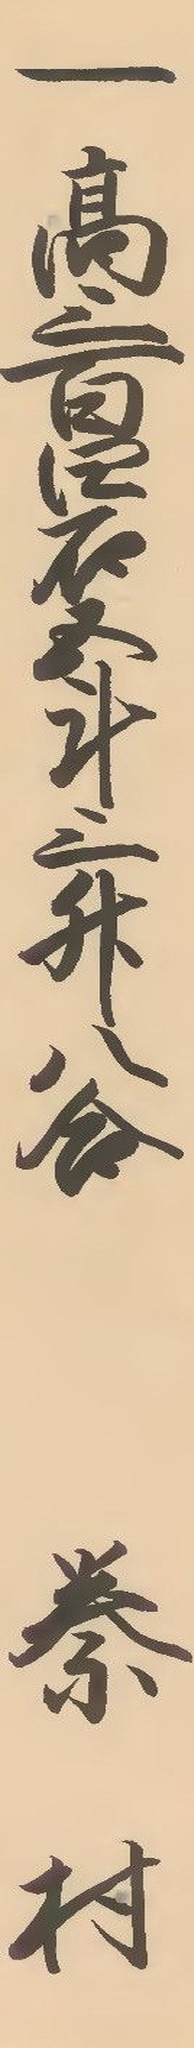一高三百四石五斗三升八合秦村
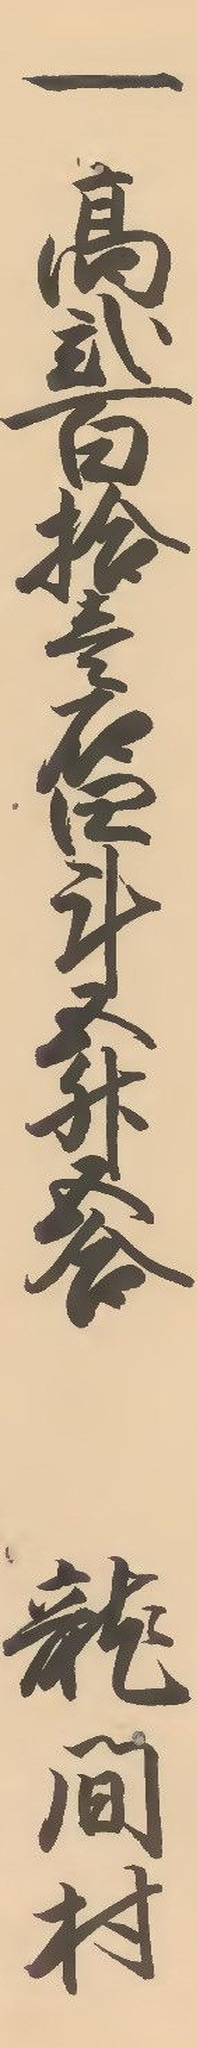一高弐百拾壱石四斗五升五合竜間村
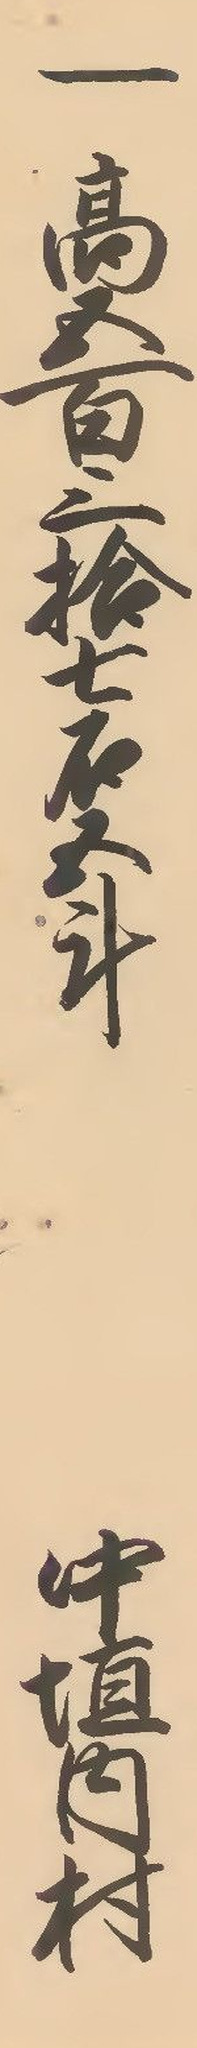一高五百三拾七石五斗中垣内村

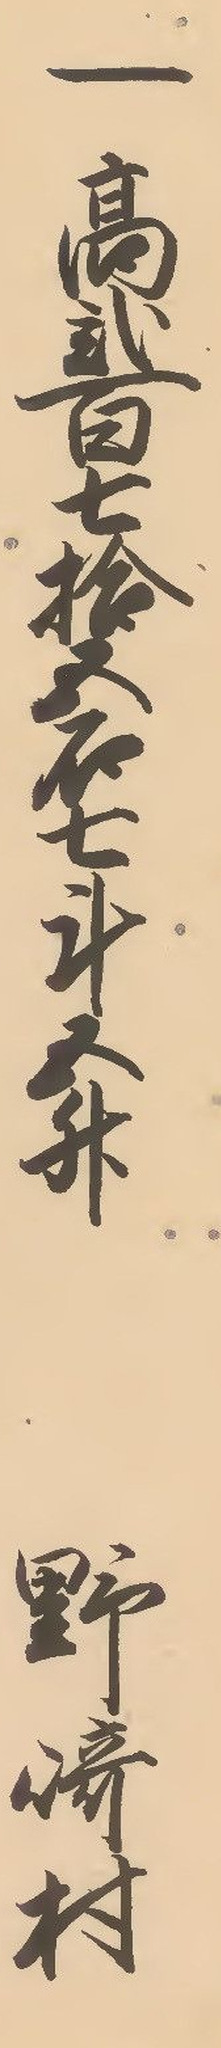一高弐百七拾五石七斗五升野崎村
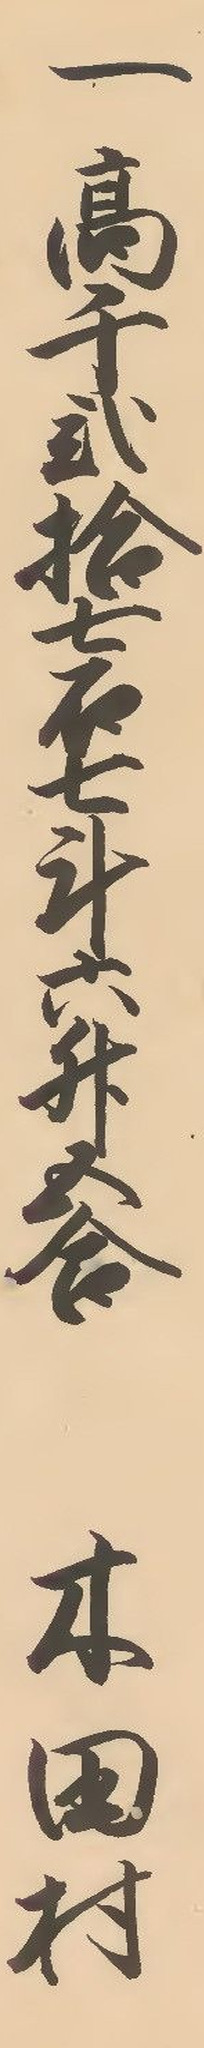一高千弐拾七石七斗六升五合木田村
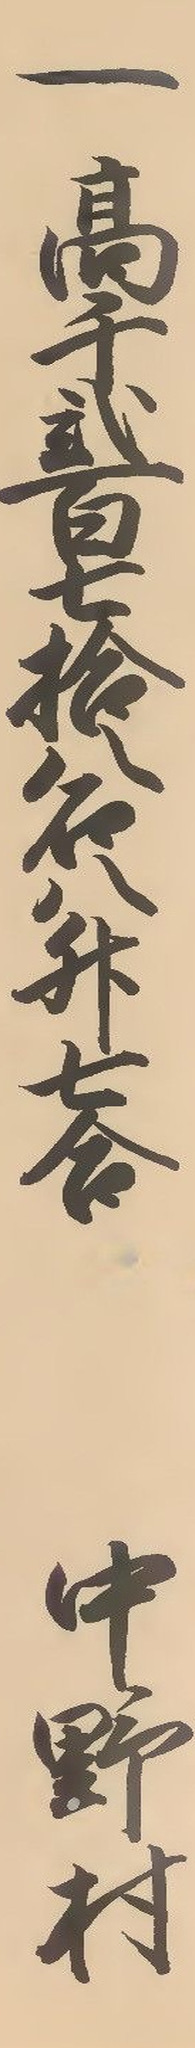一高千弐百七拾八石八升七合中野村
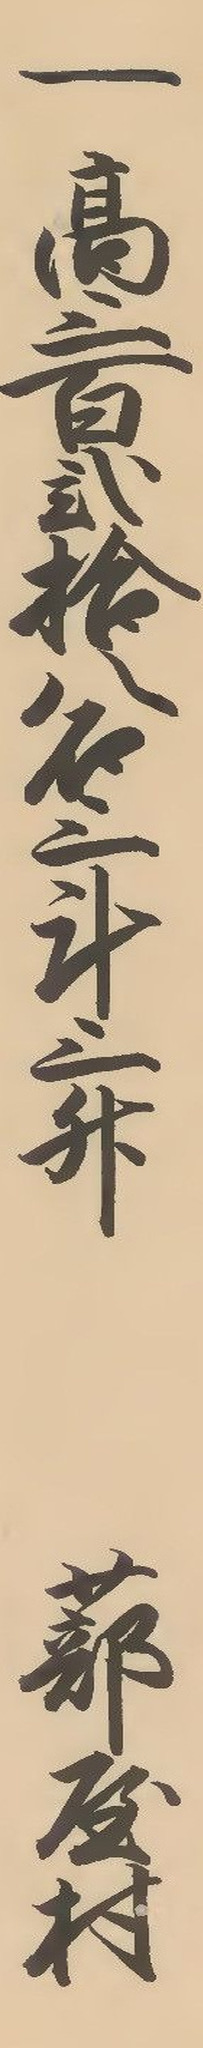一高三百弐拾八石三斗三升蔀屋村
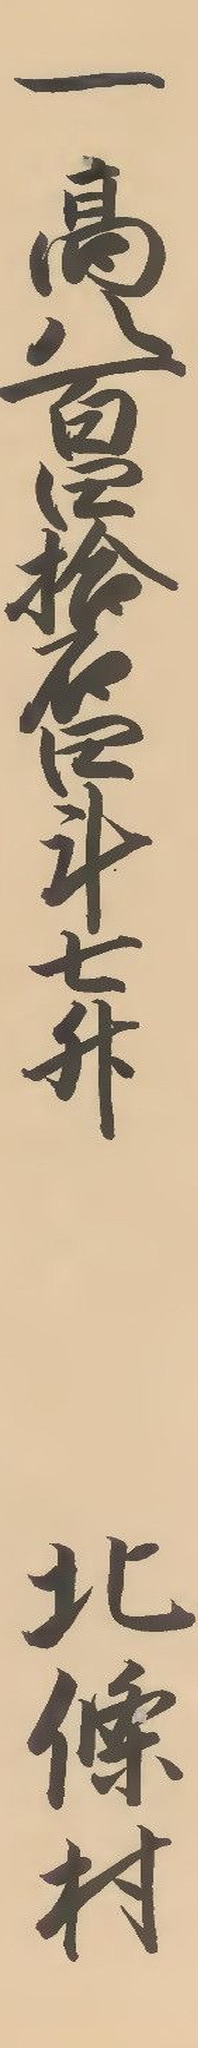一高八百四拾石四斗七升北条村
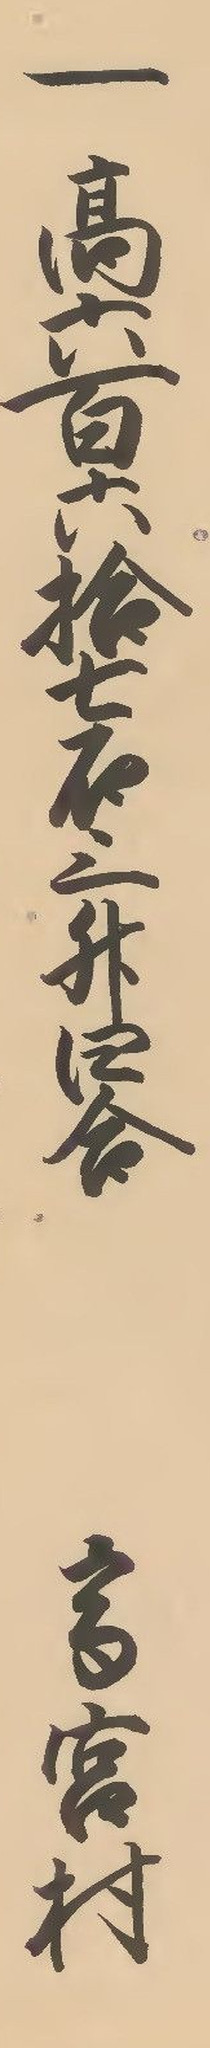一高六百六拾七石三升四合高宮村
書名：河内国郷帳
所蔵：国立公文書館 National Archives of Japan
